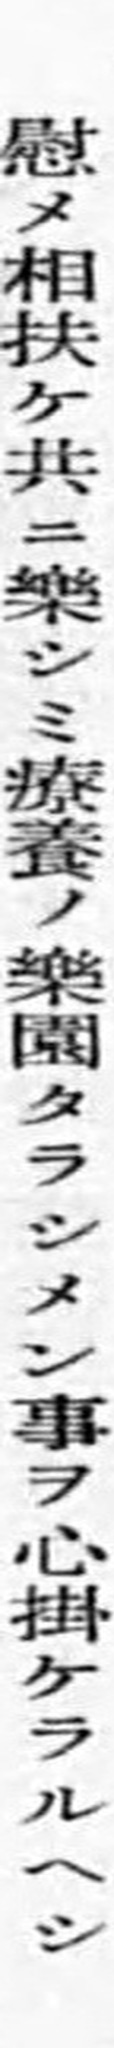慰メ相扶ケ共ニ楽シミ療養ノ楽園タラシメン事ヲ心掛ケラルヘシ
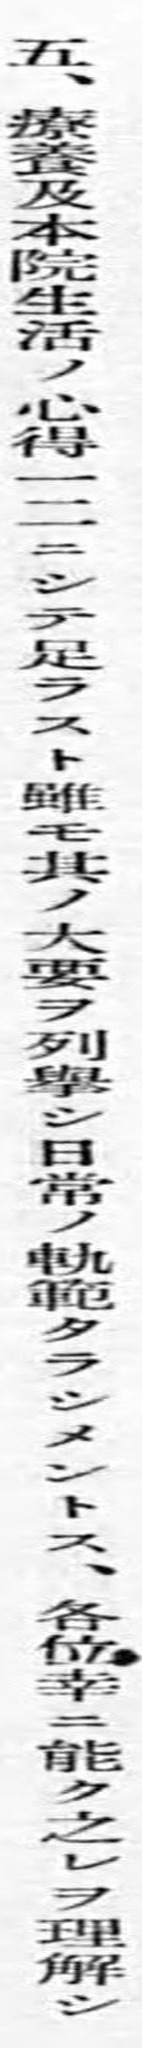五、療養及本院生活ノ心得一二ニシテ足ラスト雖モ其ノ大要ヲ列挙シ日常ノ軌範タラシメントス、各位幸ニ能ク之レヲ理解シ
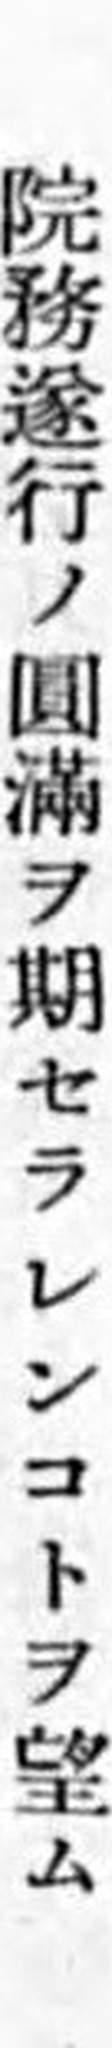院務遂行ノ円満ヲ期セラレンコトヲ望ム
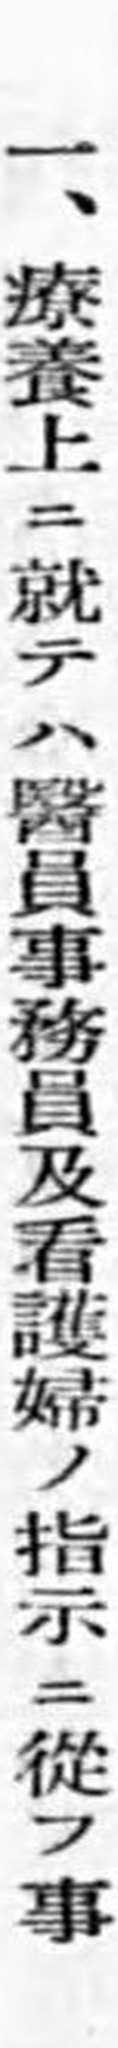一、療養上ニ就テハ医員事務員及看護婦ノ指示ニ従フ事
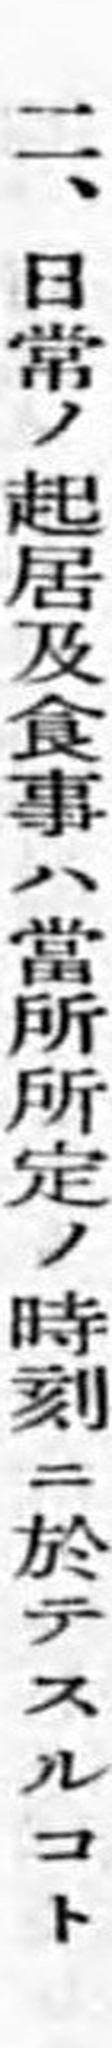二、日常ノ起居及食事ハ当所所定ノ時刻ニ於テスルコト
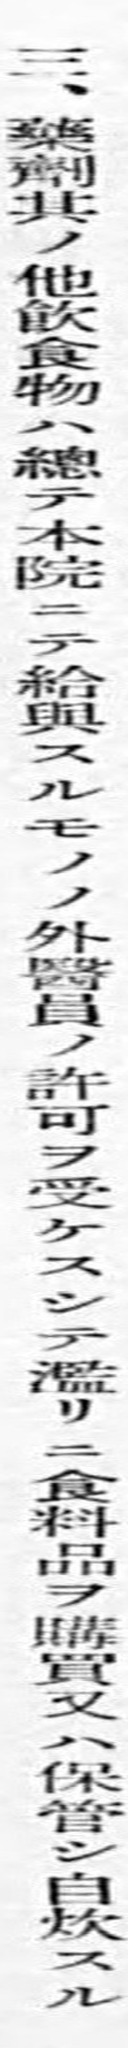三、薬剤其ノ他飲食物ハ総テ本院ニテ給与スルモノノ外医員ノ許可ヲ受ケスシテ濫リニ食料品ヲ購買又ハ保管シ自炊スル

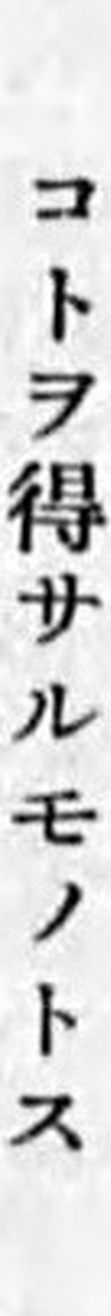コトヲ得サルモノトス
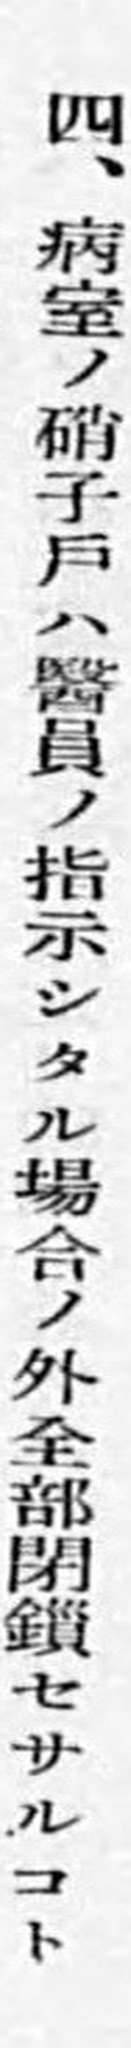四、病室ノ硝子戸ハ医員ノ指示シタル場合ノ外全部閉鎖セサルコト
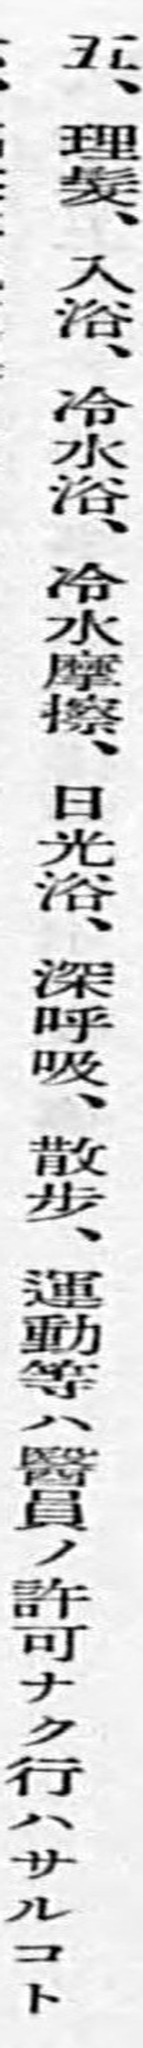五、理髪、入浴、冷水浴、冷水摩擦、日光浴、深呼吸、散水、運動等ハ医員ノ許可ナク行ハサルコト
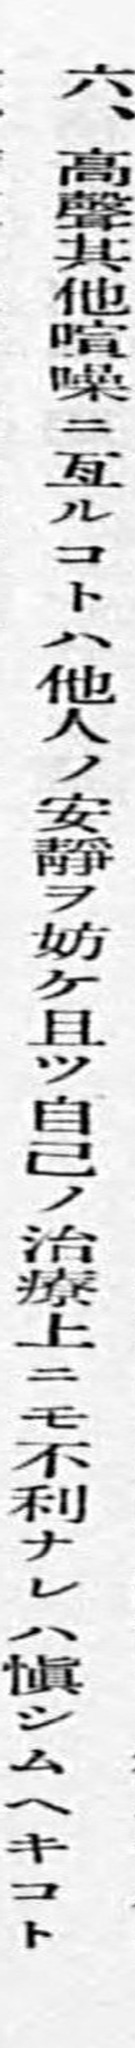六、高声其他喧噪ニ亘ルコトハ他人ノ安静ヲ妨ケ且ツ自己ノ治療上ニモ不利ナレハ慎シムヘキコト
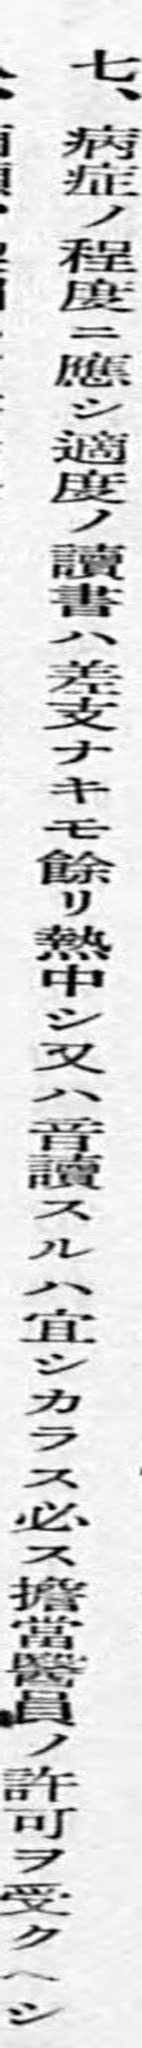七、病症ノ程度ニ応シ適度ノ読書ハ差支ナキモ余り熱中シ又ハ音読スルハ宜シカラス必ス担当医員の許可ヲ受クヘシ
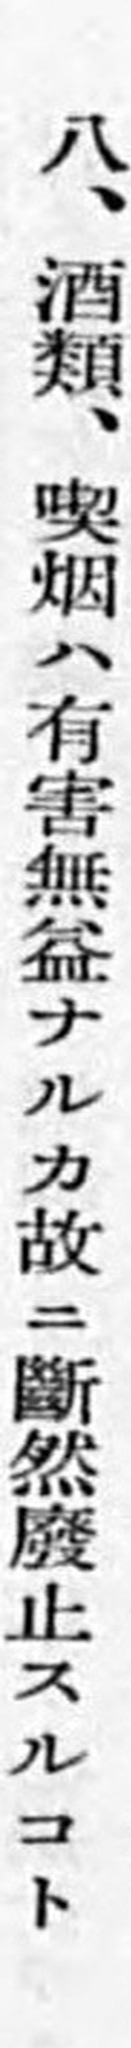八、酒類、喫烟ハ有害無益ナルカ故ニ断然廃止スルコト
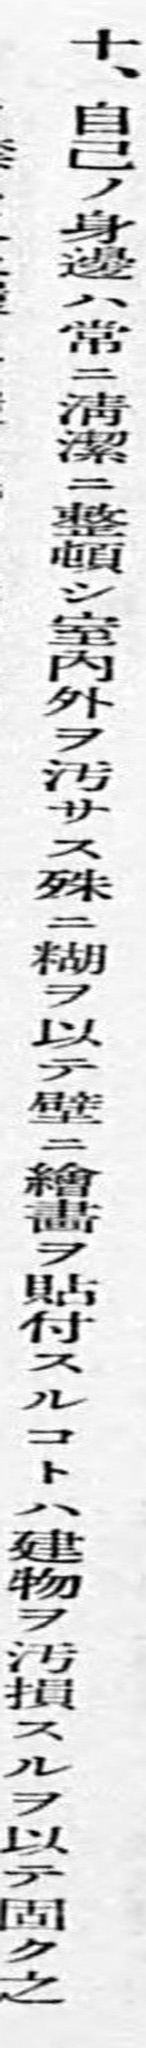十、自己ノ身辺ハ常ニ清潔ニ整頓シ室内外ヲ汚サス殊ニ糊ヲ以テ壁ニ絵画ヲ貼付スルコトハ建物ヲ汚損スルヲ以テ固ク之
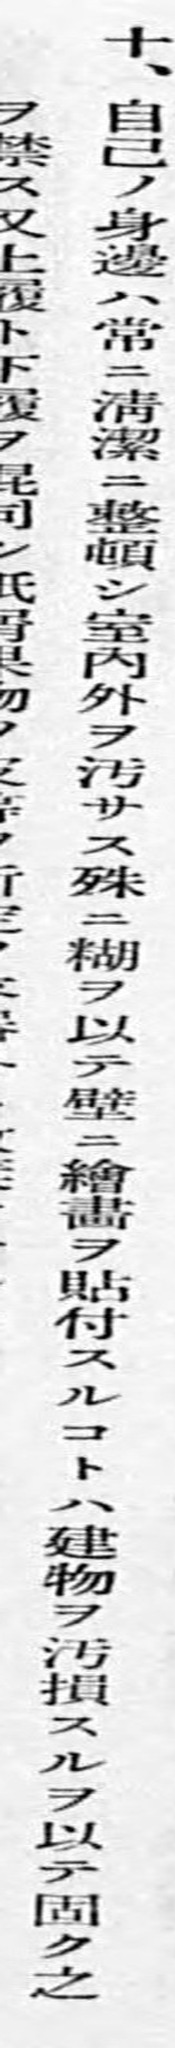十、自己ノ身辺ハ常ニ清潔ニ整頓シ室内外ヲ汚サス殊ニ糊ヲ以テ壁ニ絵画ヲ貼付スルコトハ建物ヲ汚損スルヲ以テ固ク之
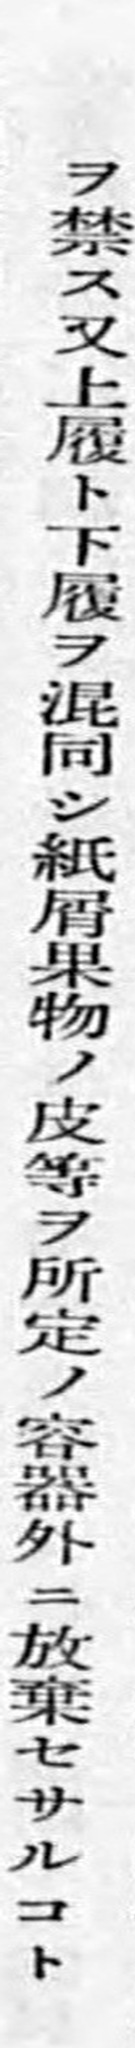ヲ禁ス又上履ト下履ヲ混同シ紙屑果物ノ皮等ヲ所定ノ容器外ニ放棄セサルコト
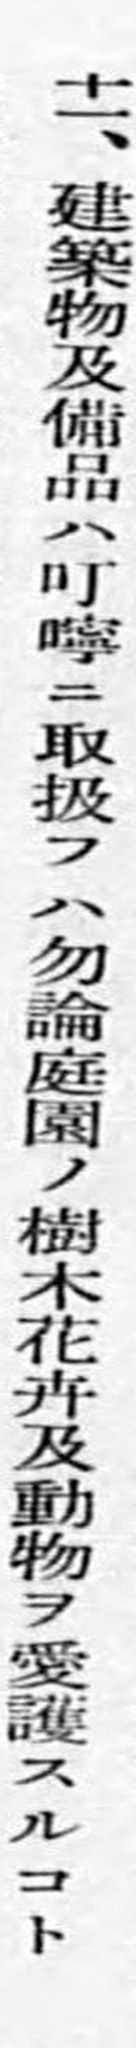十一、建築物及備品ハ叮嚀ニ取扱フハ勿論庭園ノ樹木花卉及動物ヲ愛護スルコト
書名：豊橋市立高山病院年報. 昭和12年度
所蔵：国立国会図書館 National Diet Library, JAPAN
